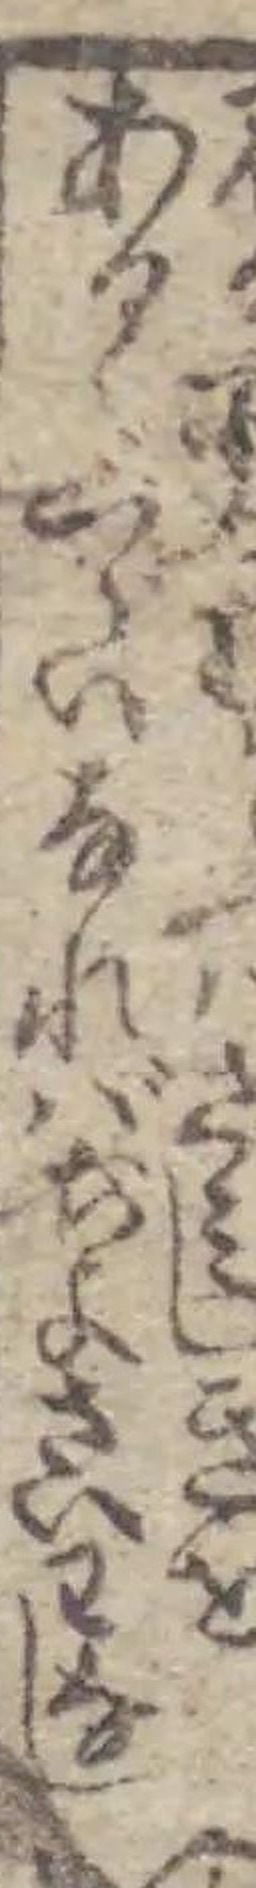あるくくらいなればぢよさいわなし
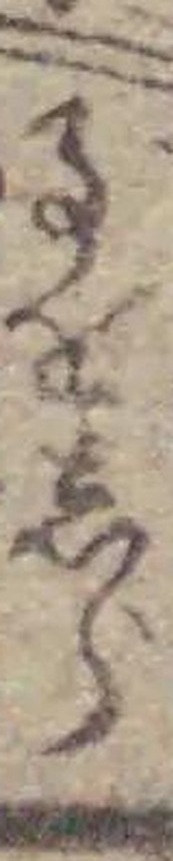事をしら
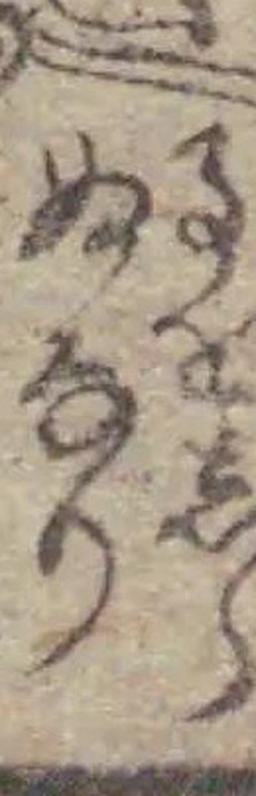ぬなり
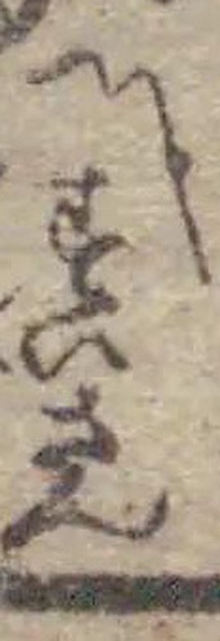「すいさん
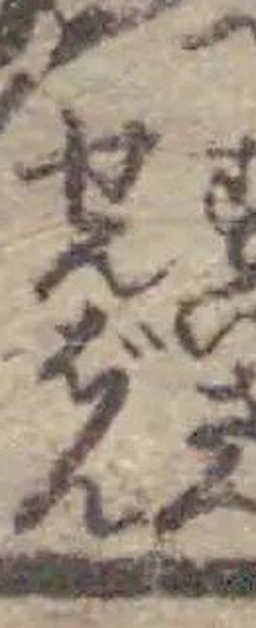せんばん
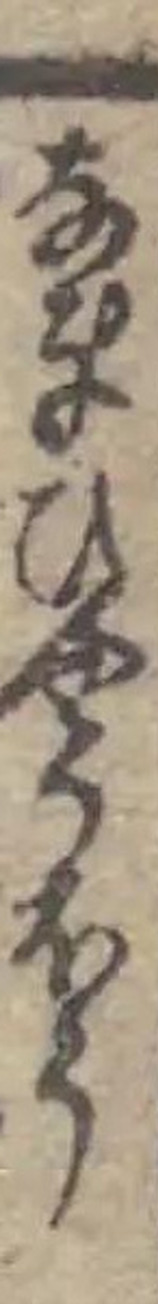なまひやうほう
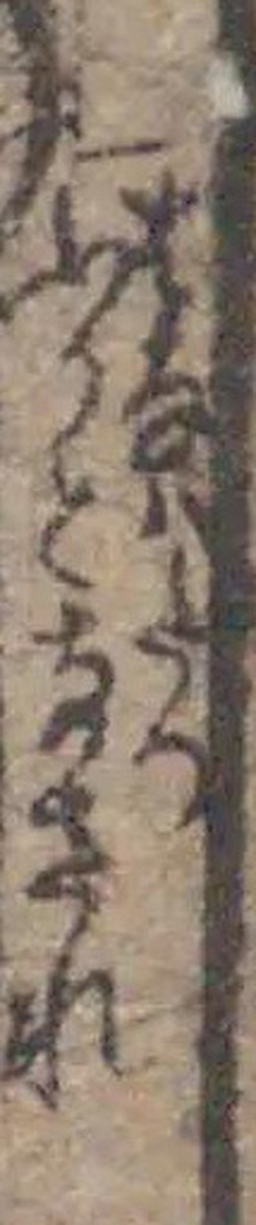ふりとなされ
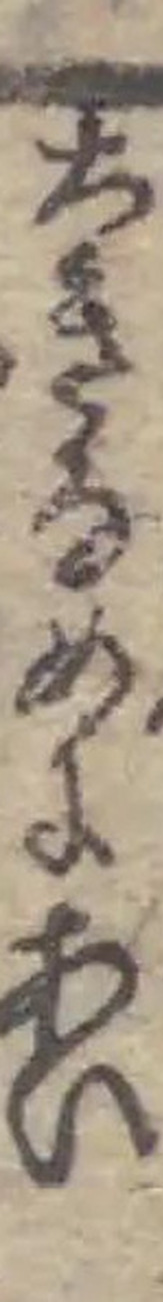大きなめにあひ
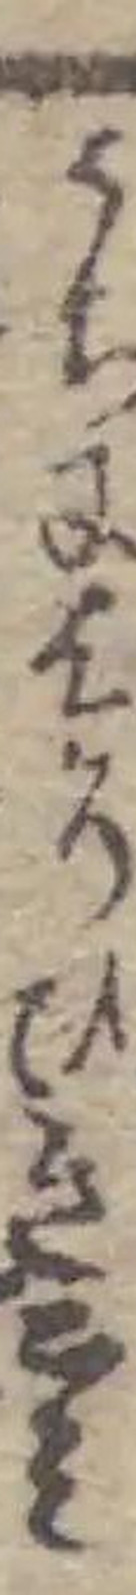うちにはかりひきこみ
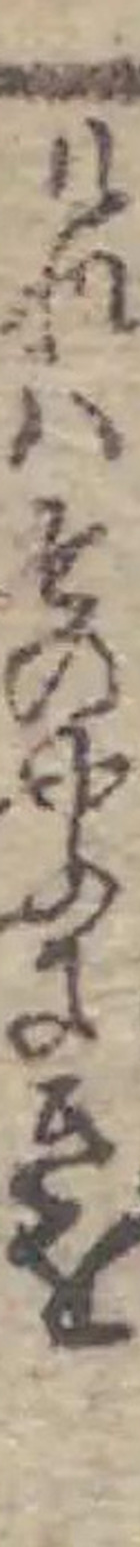けれはそのやふにきを
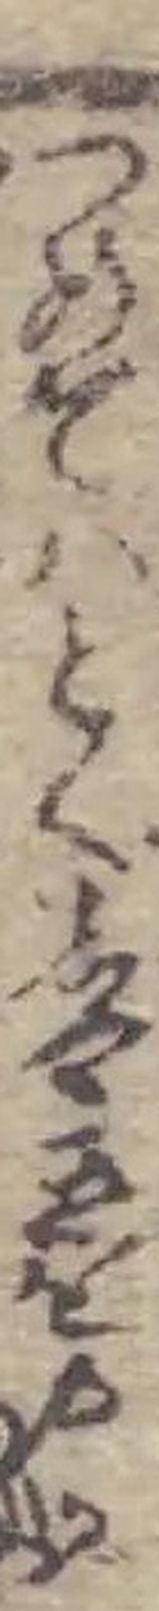つめてはどくしやきを
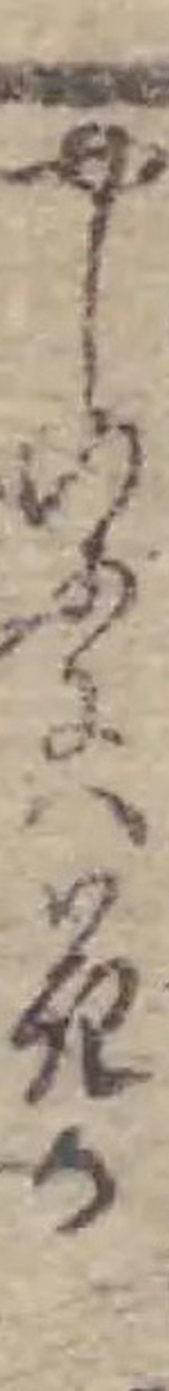やしのふには花か
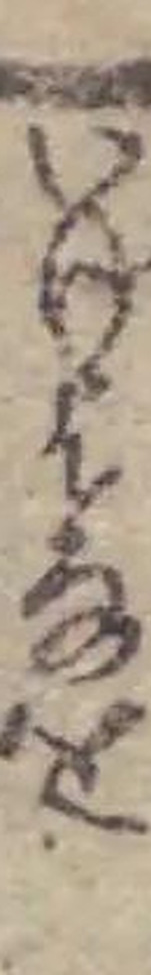いけはなを
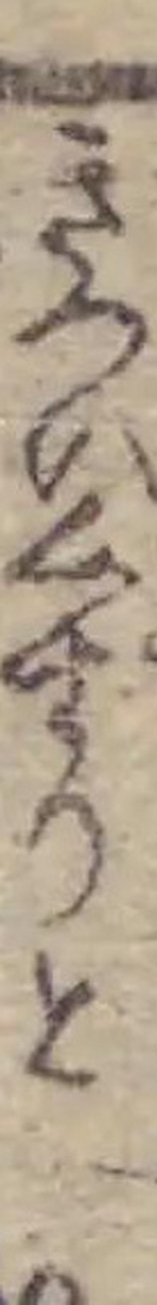きついくすりと
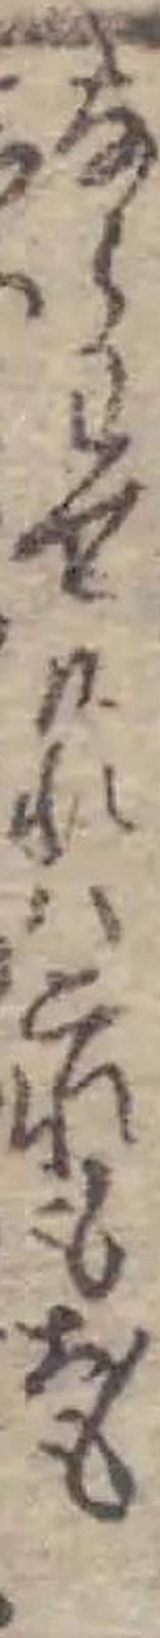ならわせけれハこれもおも
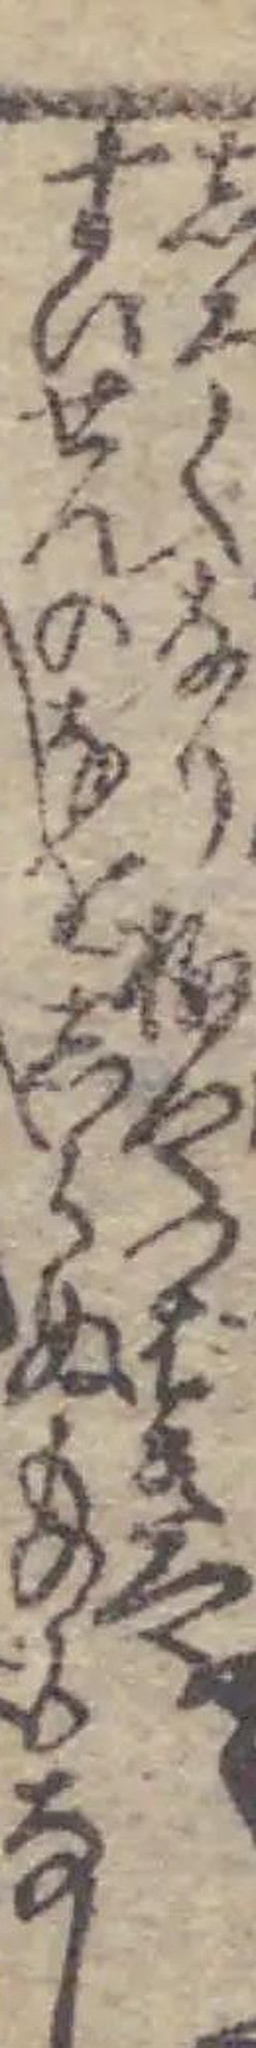すいせんのなをしらぬものもなし
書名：津以曽無弟の甚六 3巻
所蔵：国立国会図書館 National Diet Library, JAPAN
